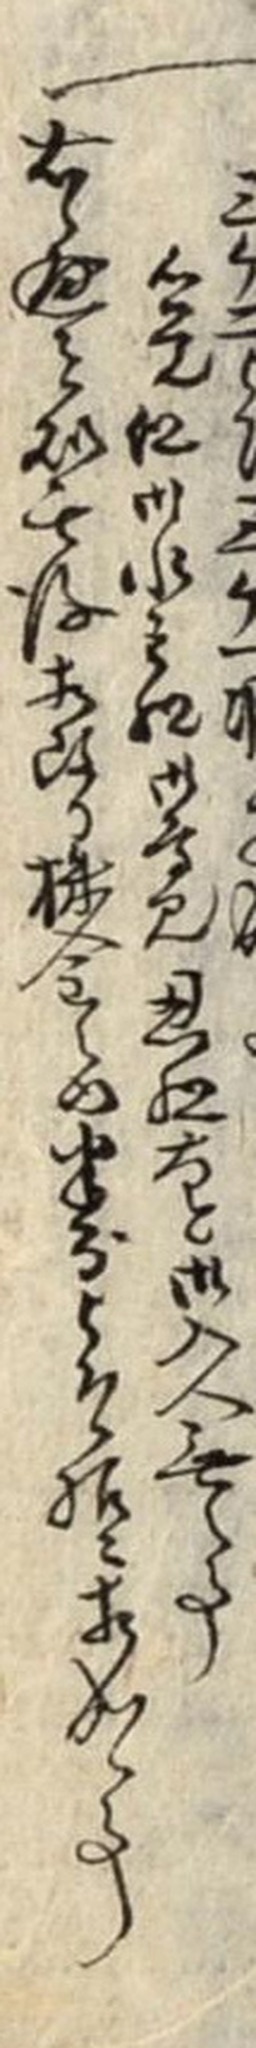右之通に候処其後相改り株金之内半分被下候様に相成候事
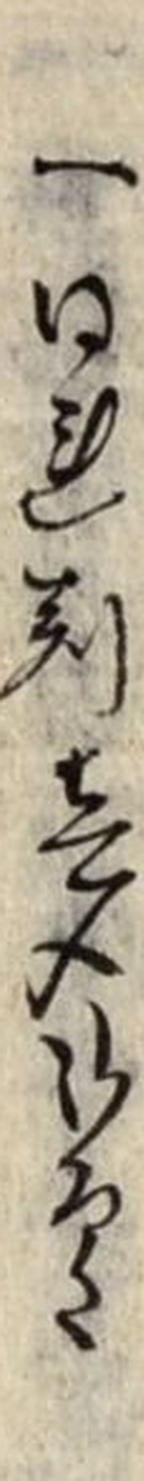一同連判壱貫弐百匁
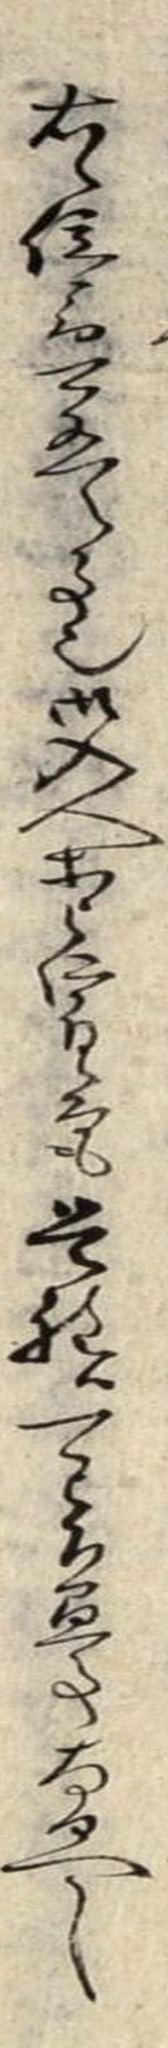右之位に而可有之事也御入人等被仰付候而も是程は可被下置事なるへし
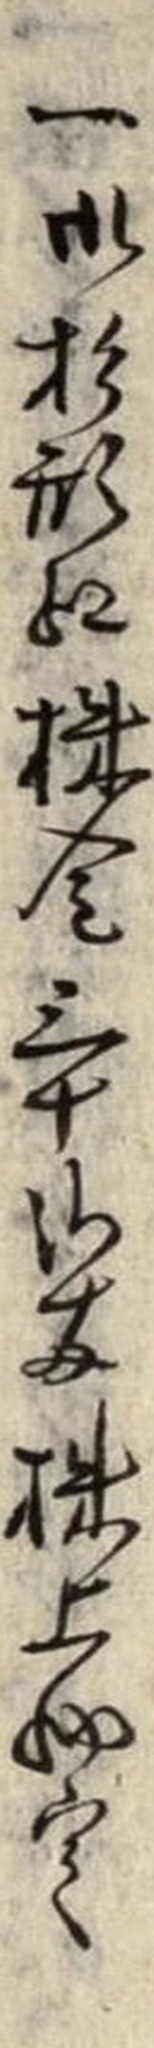一御杉形組株金三十弐両株上納定
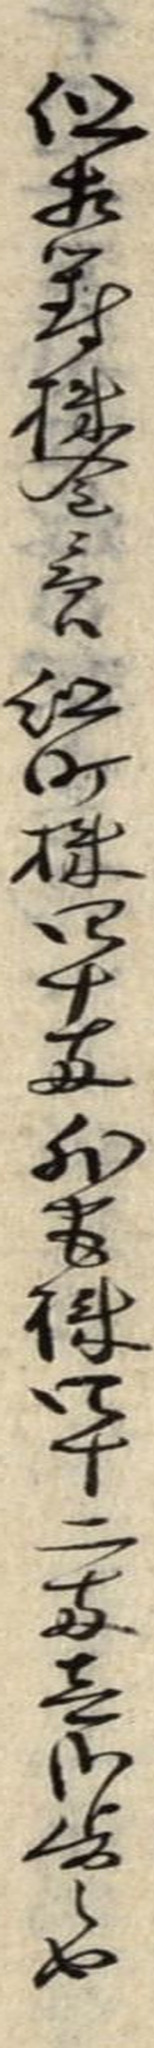但相対株金に而は組町株四十両外宅株四十二両壱弐歩之由

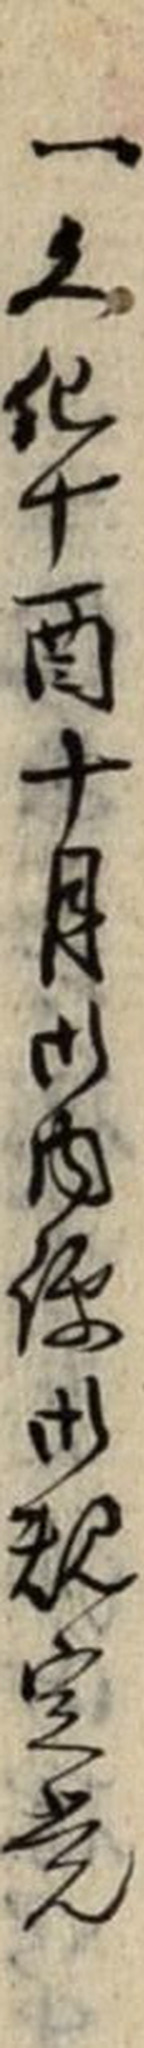一文化十酉十月御内評御規定覚
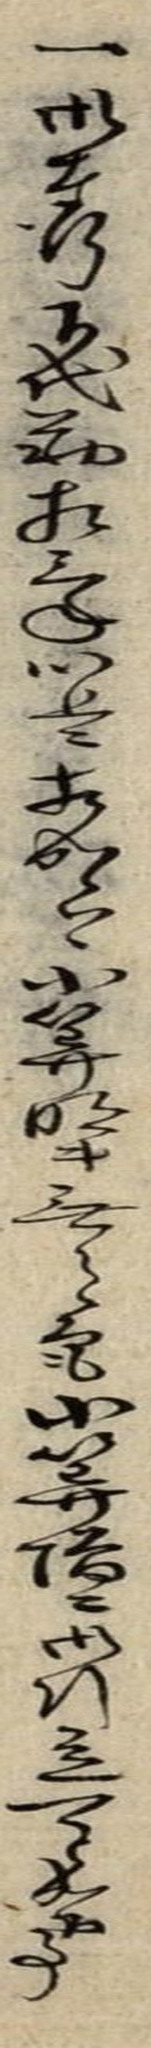一御奉行下代勤拾三年以上に相成候はゝ小算明キ無之候而も小算増に御引立可被成下事
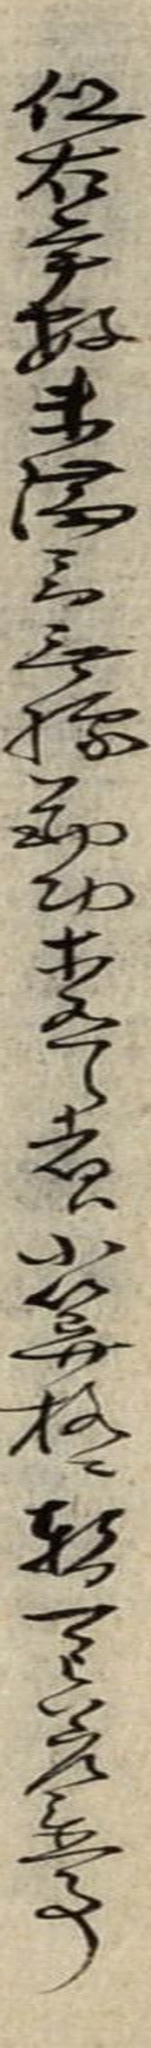但右年数未満に而無拠勤功等有之者は小算格に暫可被差置事
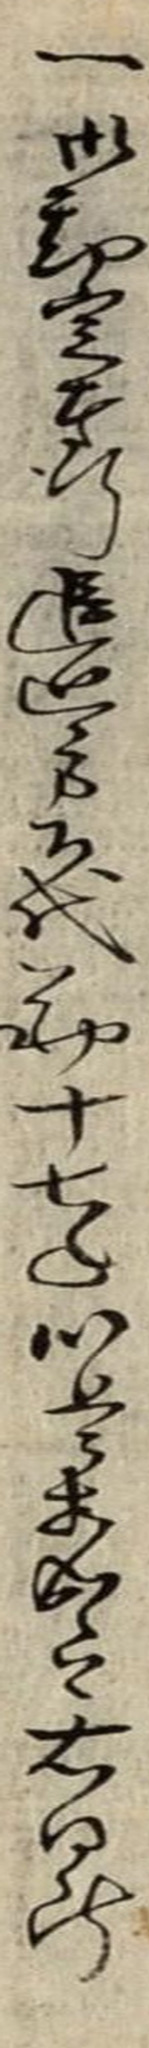一御勘定奉行追廻方下代勤十七年以上に相成候はゝ右同断
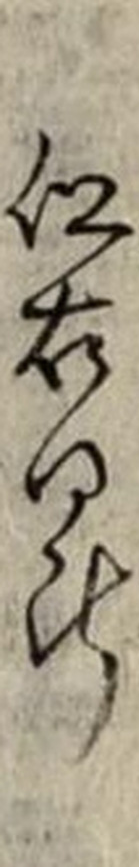但右同断
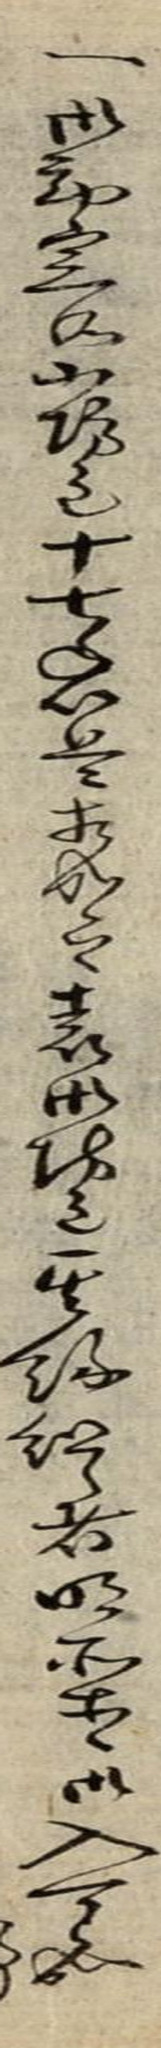一御勘定所小坊主十七年以上に相成候はゝ表御坊主其余組之者明所等へ御入可被成事
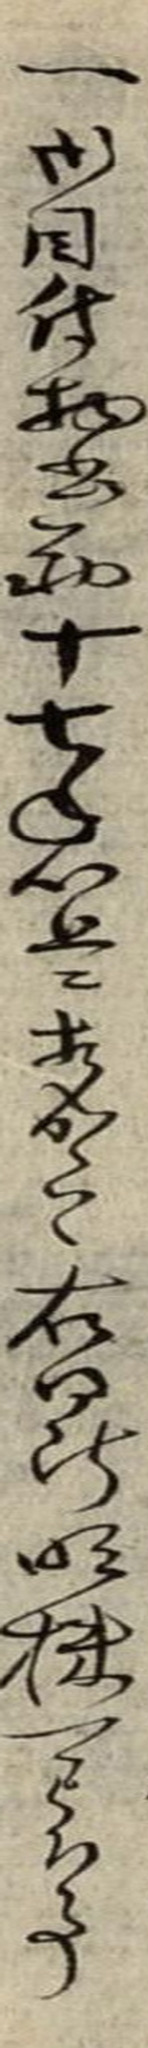一御目付物書勤十七年以上に相成候はゝ右同断明株可被下事
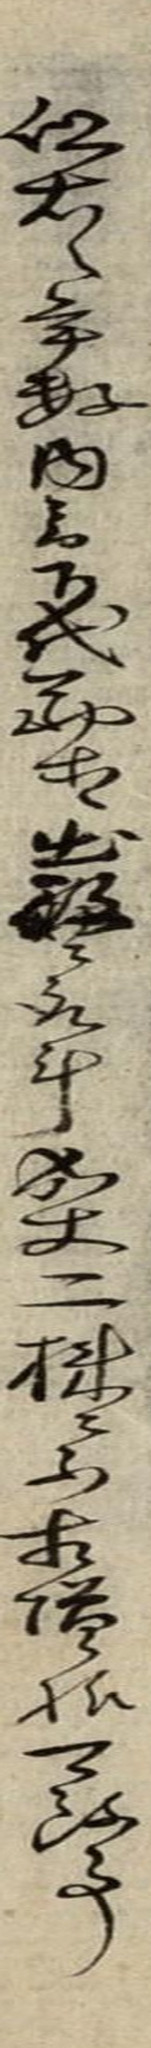但右之年数内に而下代勤等出役に取斗成丈二株に不相増候様可致事
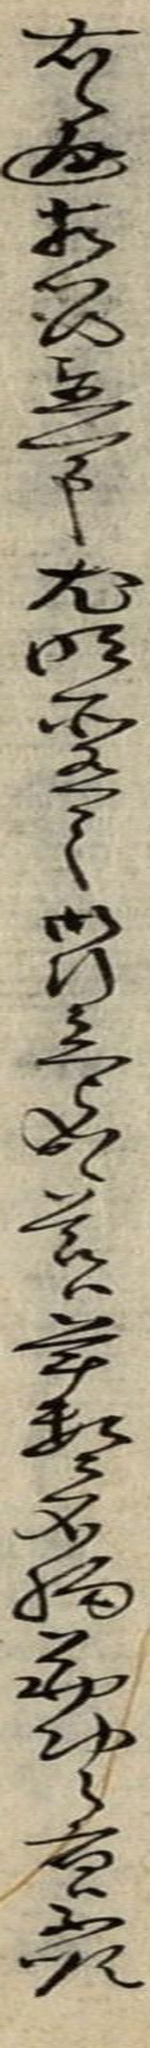右之通相心得置可申尤明所有之御引立被成候節は年数に不拘勤功之者は不順
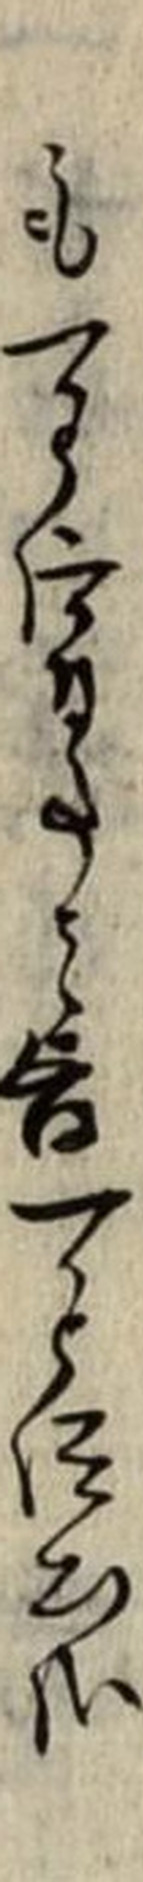にも可被仰付事之旨可被仰出哉
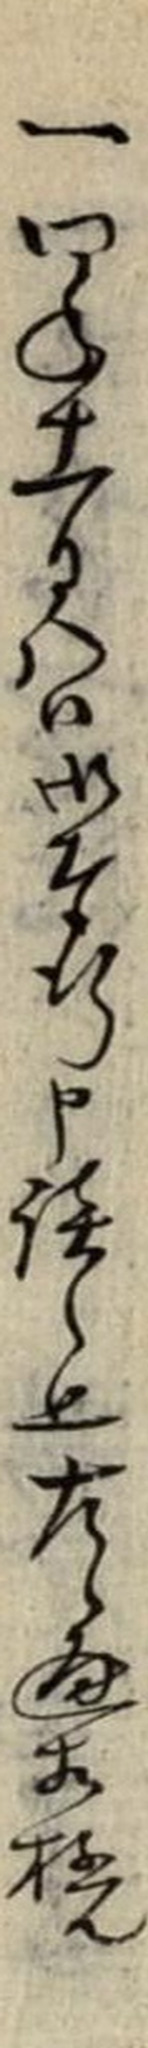一同年十一月八日御奉行申談之上左之通相極ル
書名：御用并被仰出之部
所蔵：福井県文書館 Fukui Prefectural Archives
